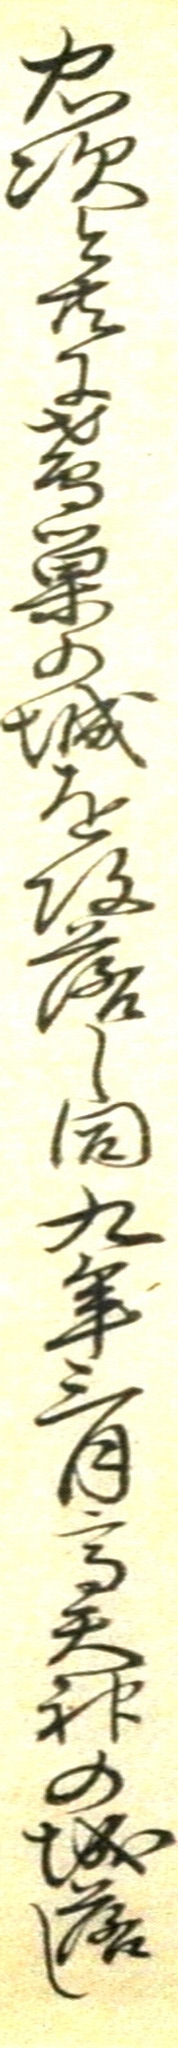忠次と共に鳶巣の城を攻落し同九年三月高天神の城落し
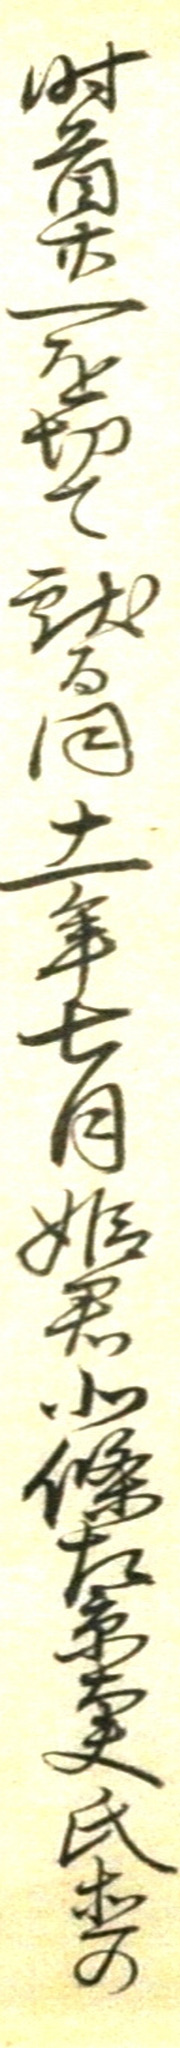時首廿一を切て献る同十一年七月姫君北条左京太夫氏直の
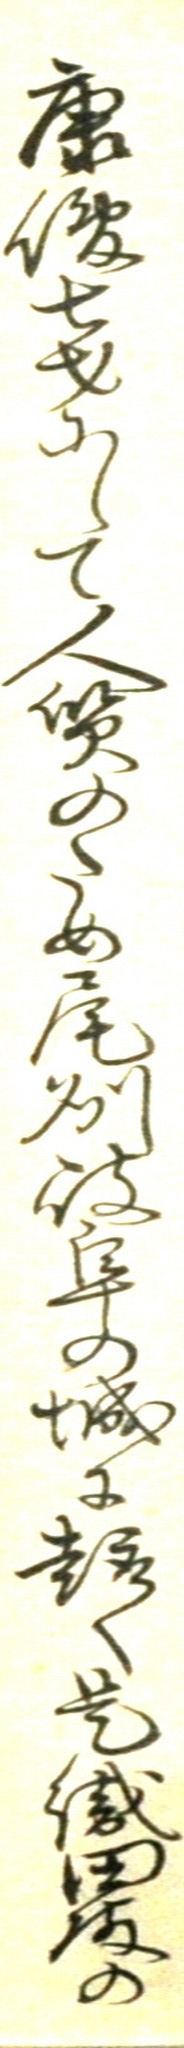康俊七才にして人質のため尾州岐阜の城に趣く是織田殿の
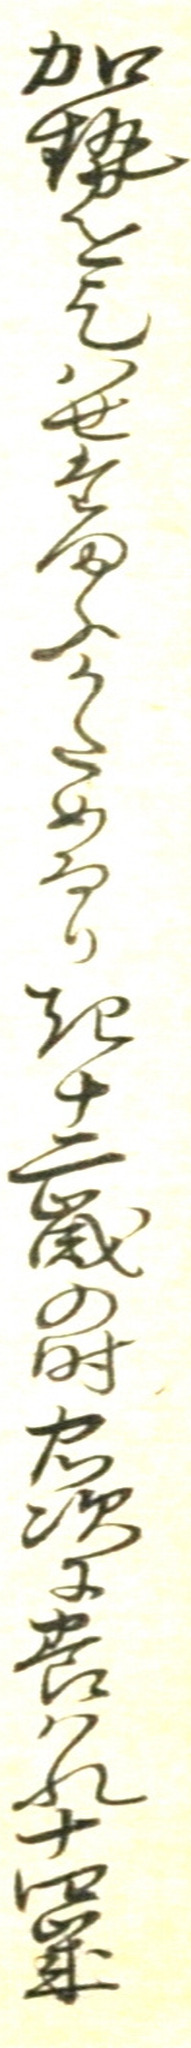加勢を乞はせたまふかためなりき十二歳の時忠次に養はれ十四歳
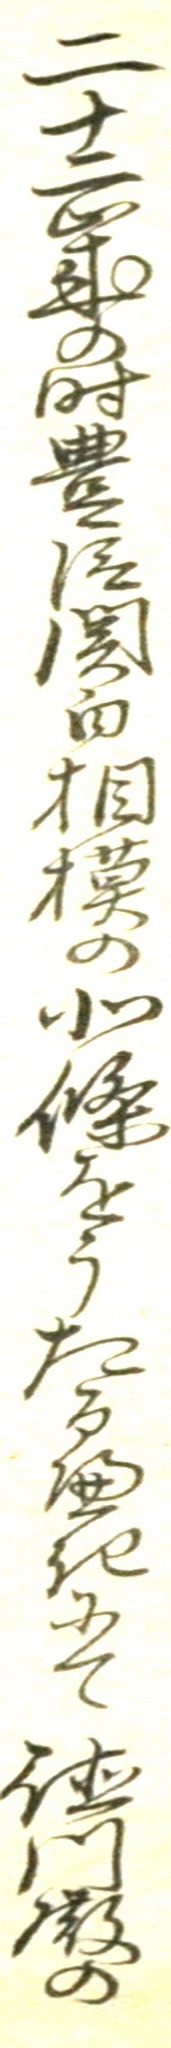二十二歳の時豊臣関白相模の北条をうたるへきにて徳川殿の
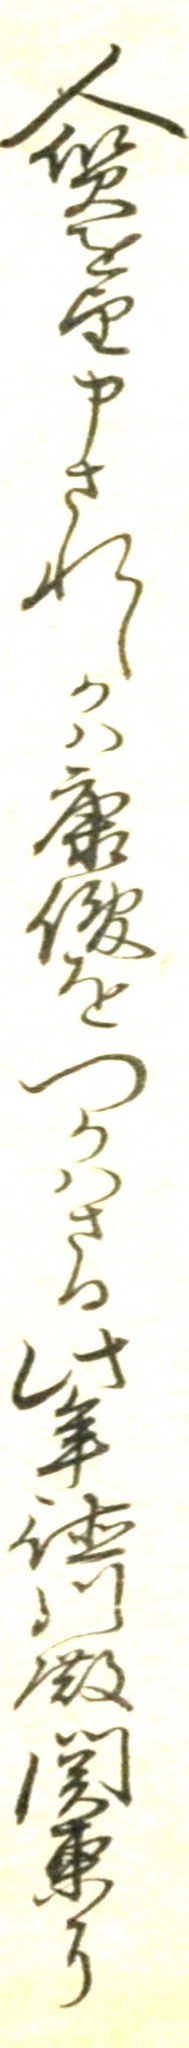人質を望申されしかは康俊をつかはさる此年徳川殿関東に
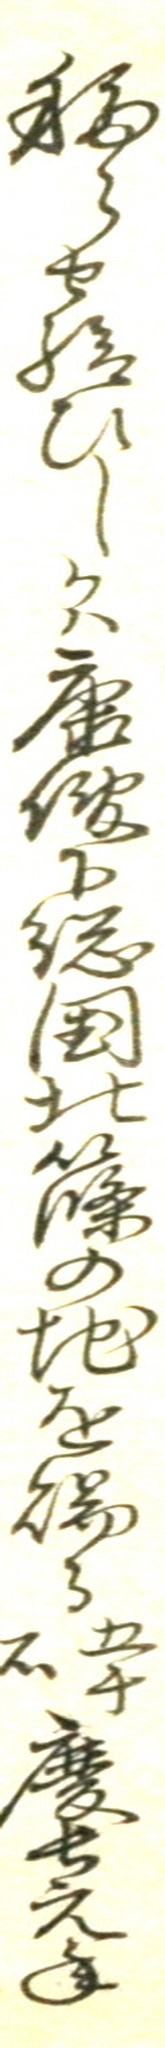移らせ給ひしかは康俊下総国北条の地を賜る五千石慶長元年
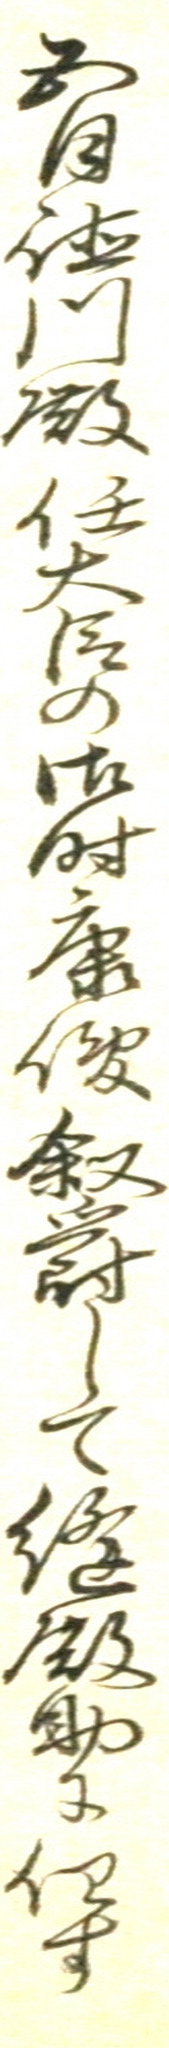五月徳川殿任大臣の御時康俊叙爵して縫殿助に任す
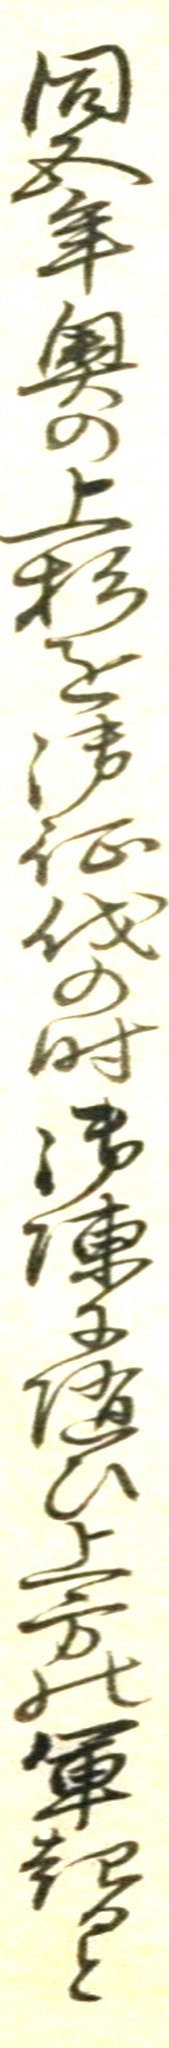同五年奥の上杉を御征伐の時御陣に随ひ上方の軍起ると
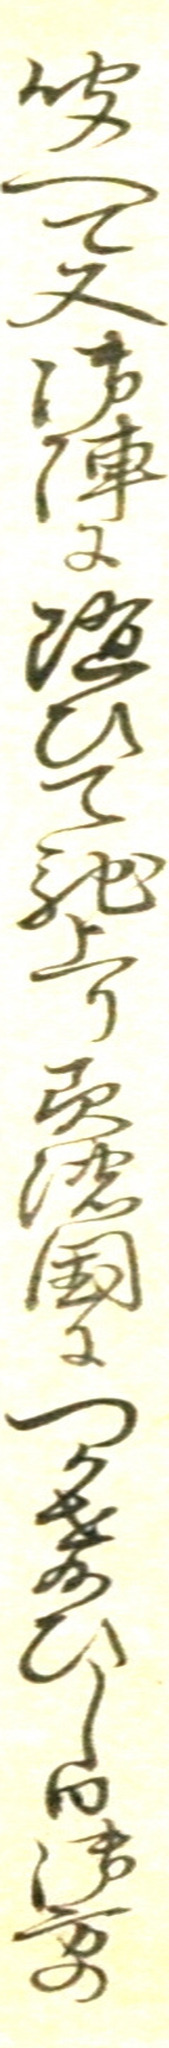聞へて又御陣に随ひて馳上り美濃国につかせ給ひし日御方の
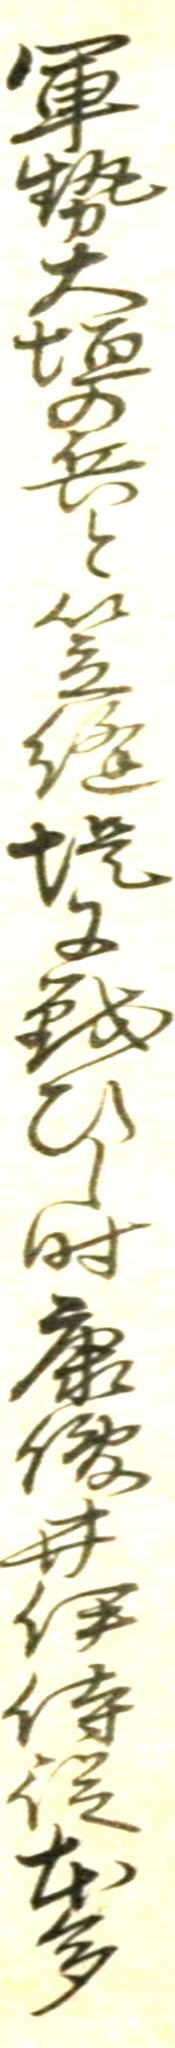軍勢大垣の兵と笠縫堤に戦ひし時康俊井伊侍従本多
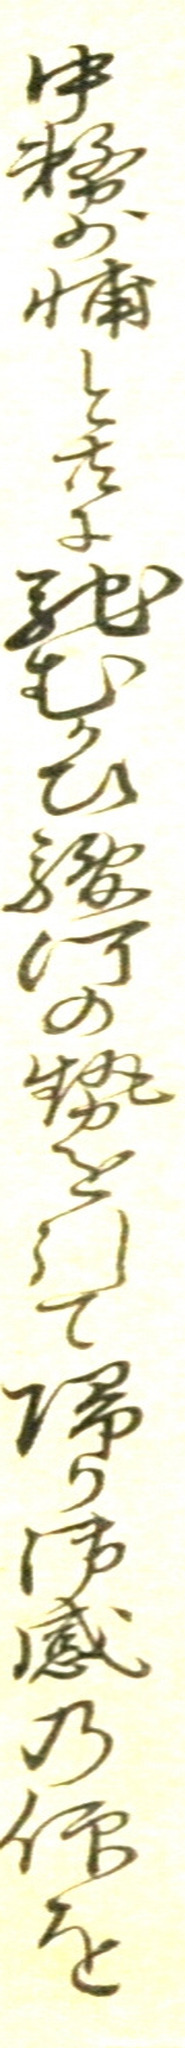中務少輔と共に馳むかひ駿河の勢を引て帰り御感の仰を

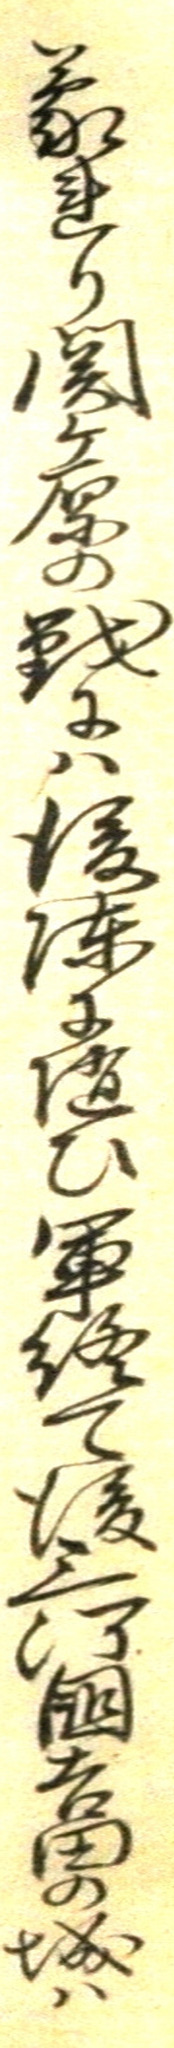蒙れり関ヶ原の戦には後陣に随ひ軍終て後三河国吉田の城は
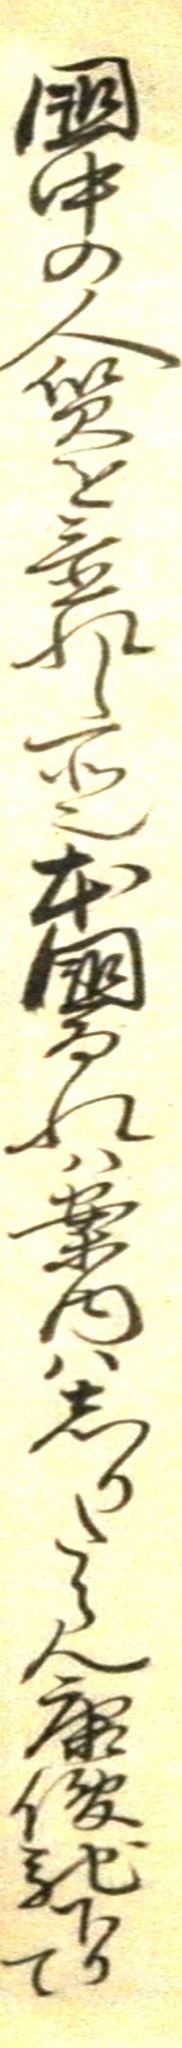国中の人質を置れし所也本国なれは案内はしりたらん康俊馳下りて
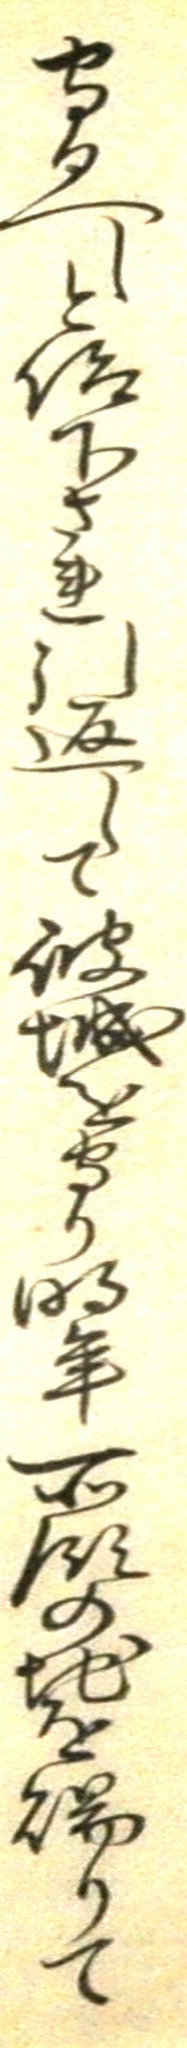守るへしと仰下され引返して彼城を守り明年所領の地を賜りて
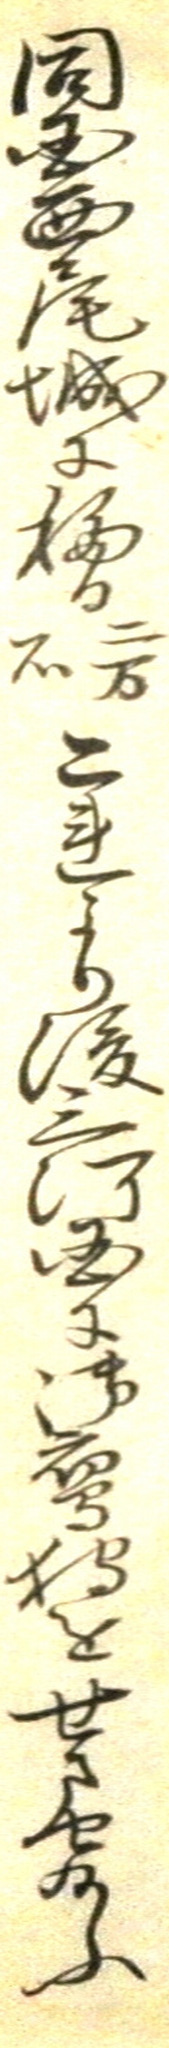同国西尾城に移る二万石これより後三河国に御鷹狩をせさせ給ふ
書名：藩翰譜（四・上）
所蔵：伊那市立高遠町図書館・合同会社AMANE
